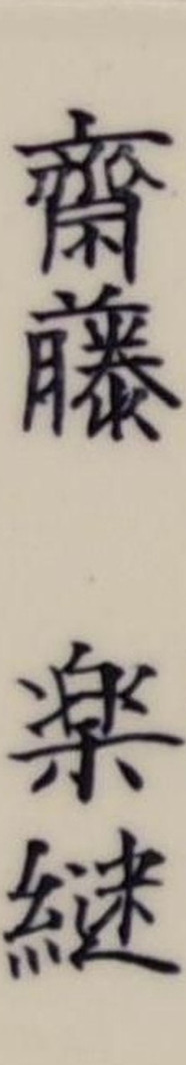斎藤楽継
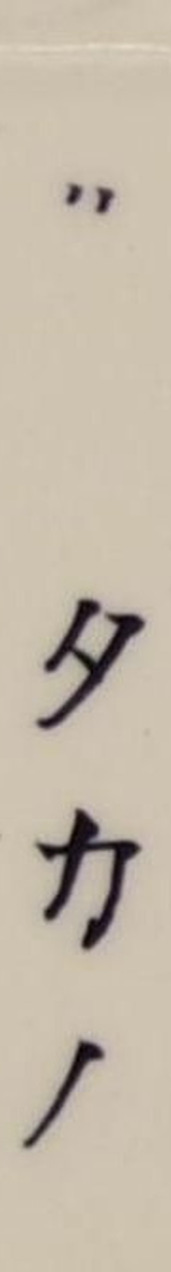タカノ
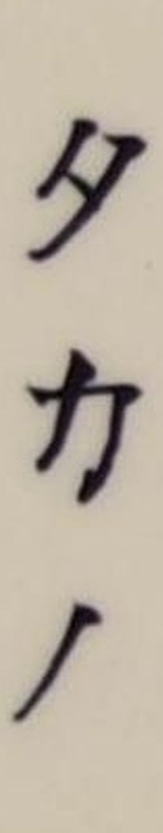タカノ
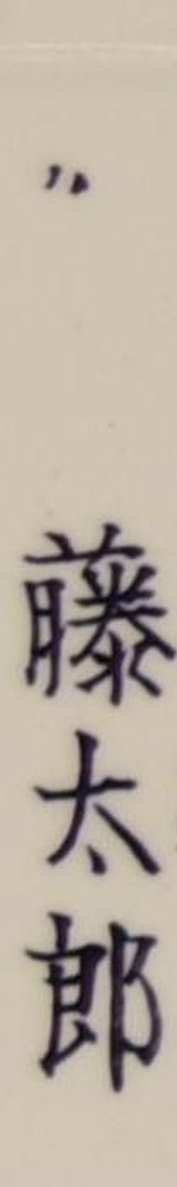藤太郎
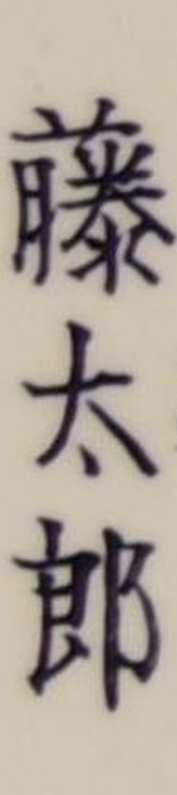藤太郎
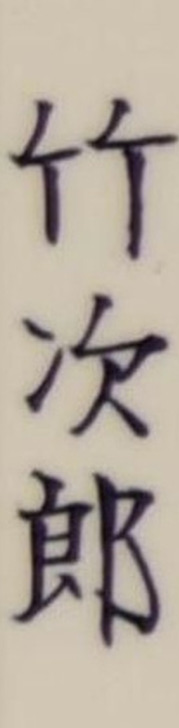竹次郎

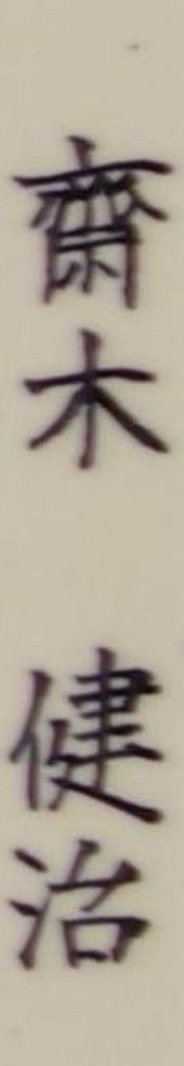斎木健治
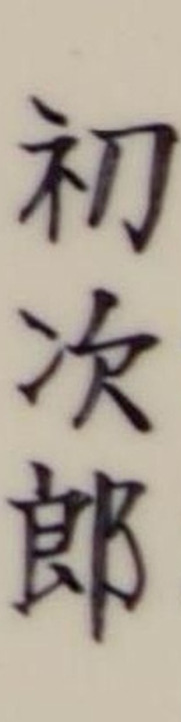初次郎
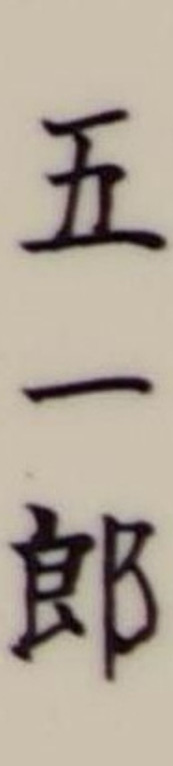五一郎
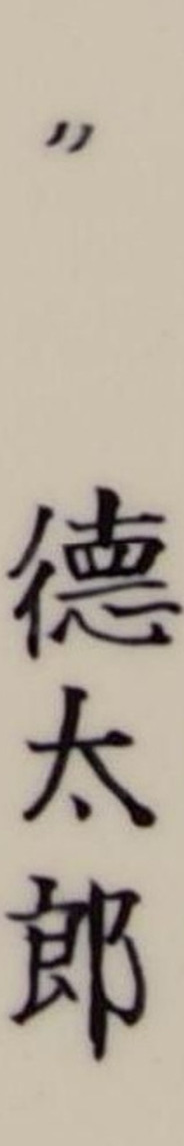徳太郎
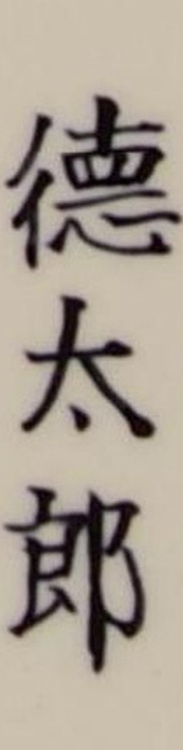徳太郎
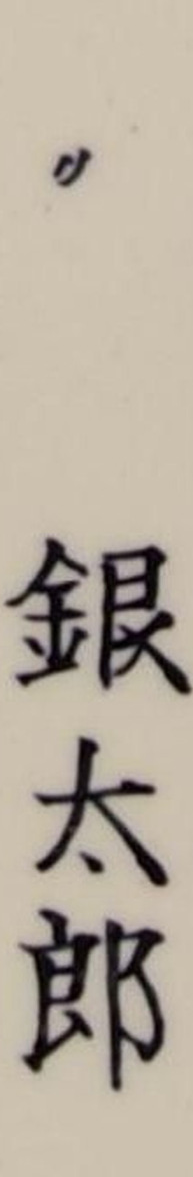銀太郎
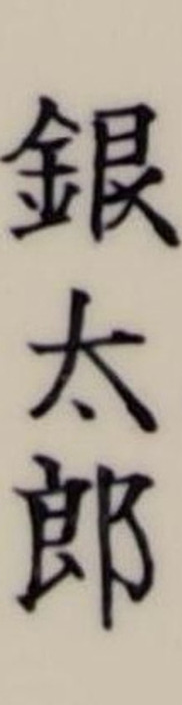銀太郎
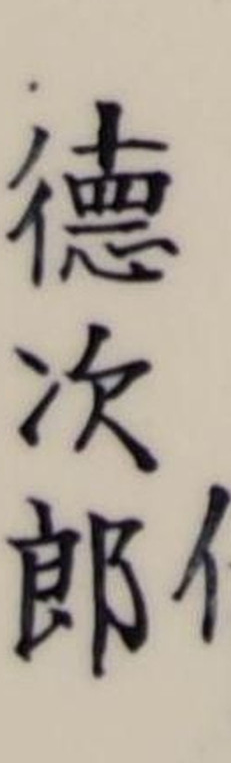徳次郎
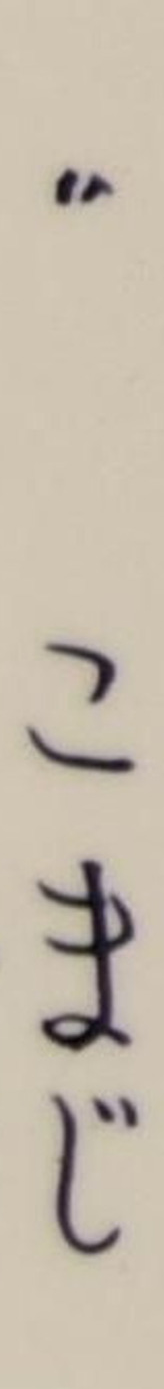こまじ
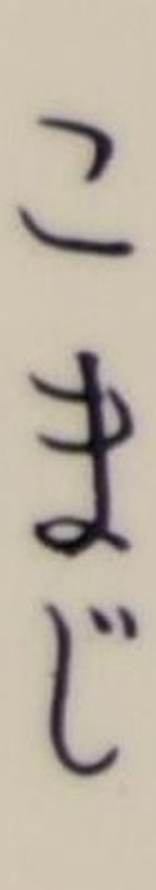こまじ
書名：E~L
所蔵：高野山金剛峯寺
